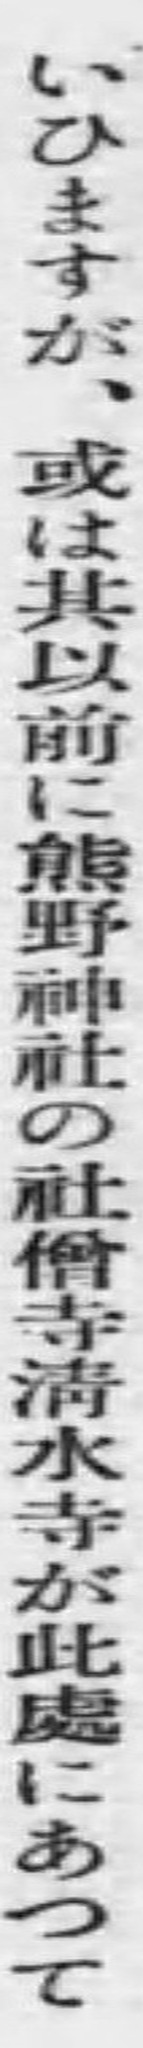いひますが、或は其以前に熊野神社の社僧寺清水寺が此処にあつて
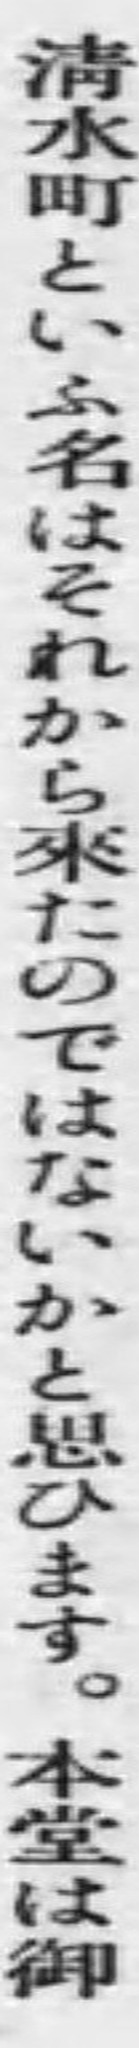清水町といふ名はそれから来たのではないかと思ひます。本堂は御
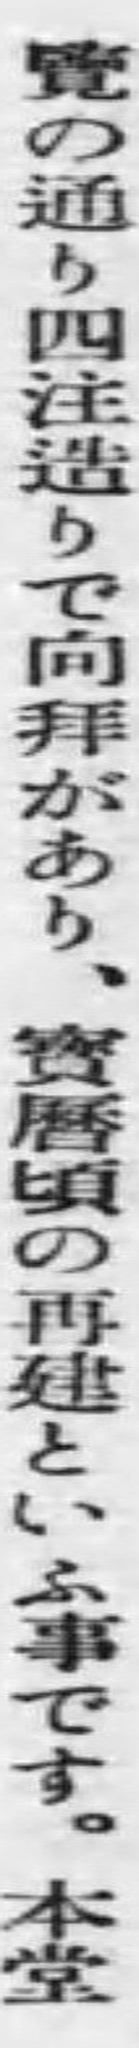覧の通り四注造りで向拝があり、宝暦頃の再建といふ事です。本堂
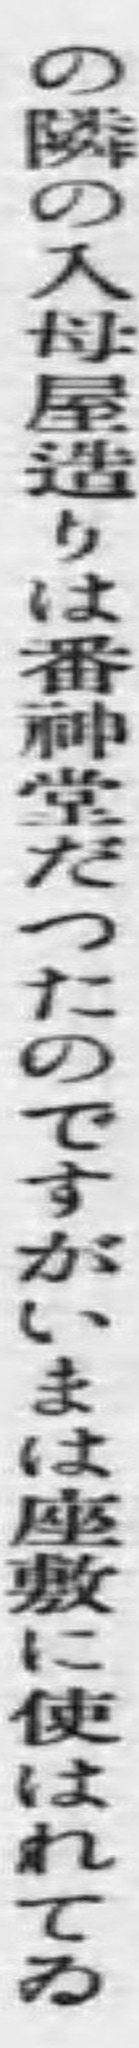の隣の入母屋造りは番神堂だつたのですがいまは座敷に使はれてゐ
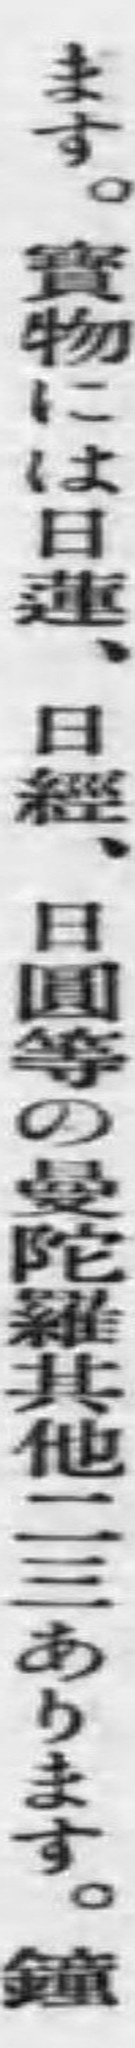ます。宝物には日蓮、日経、日円等の曼陀羅其他二三あります。鐘
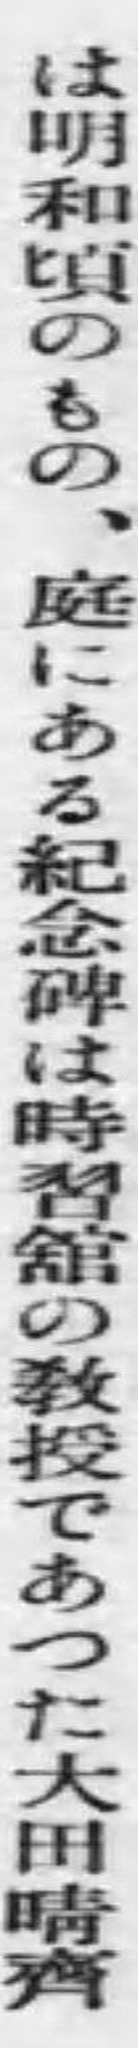は明和頃のもの、庭にある紀念碑は時習館の教授であつた大田晴斉
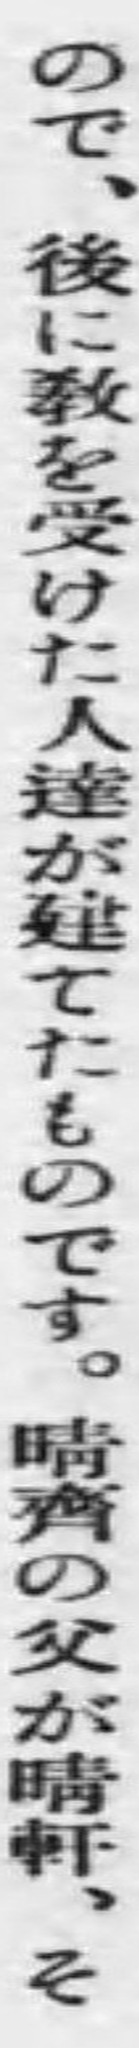ので、後に教を受けた人達が建てたものです。晴斉の父が晴軒、そ
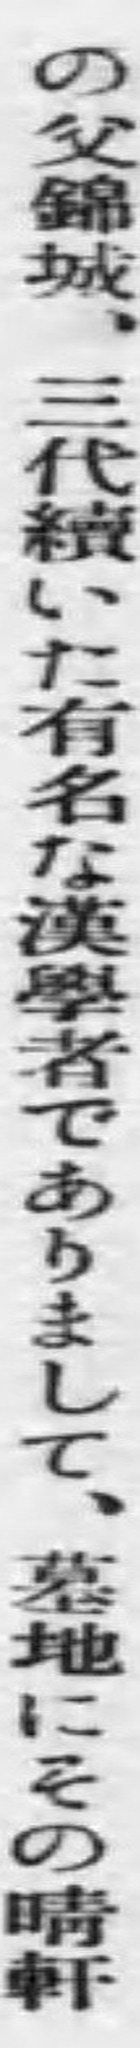の父錦城、三代続いた有名な漢学者でありまして、墓地にその晴軒
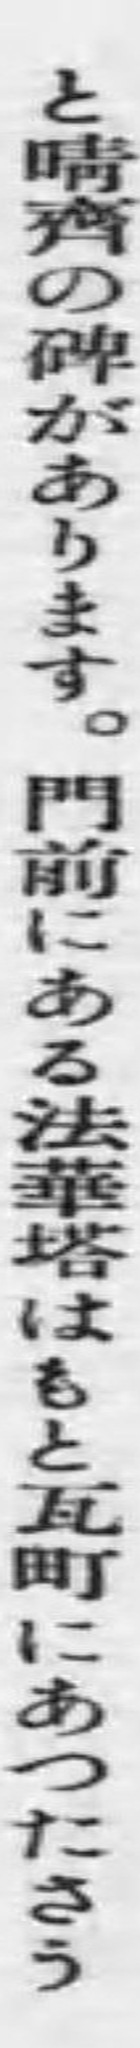と晴斉の碑があります。門前にある法華塔はもと瓦町にあつたさう
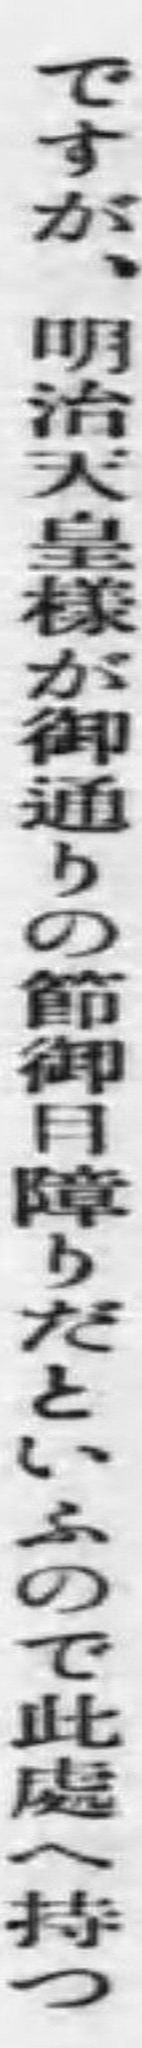ですが、明治天皇様が御通りの節御目障りだといふので此処へ持つ
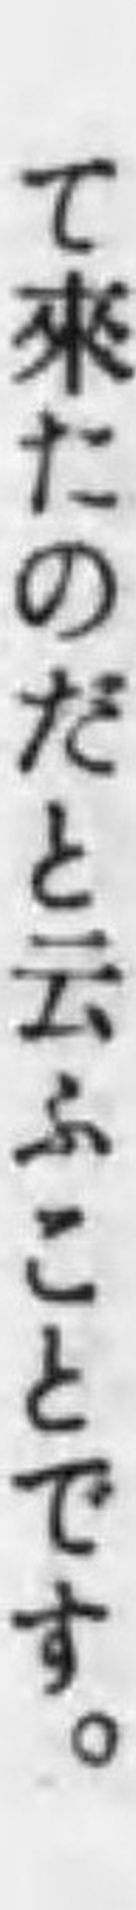て来たのだと云ふことです。

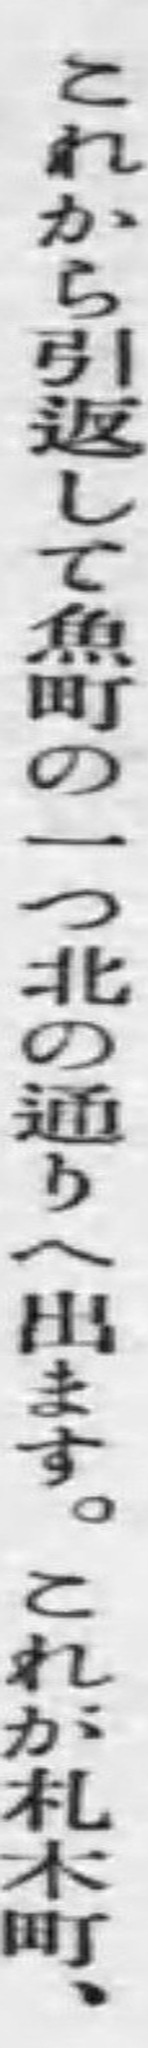これから引返して魚町の一つ北の通りへ出ます。これが札木町、
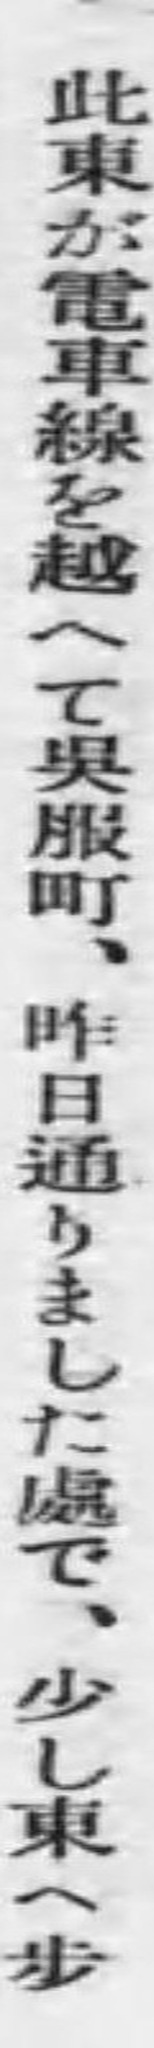此東が電車線を越へて呉服町、昨日通りました処で、少し東へ歩
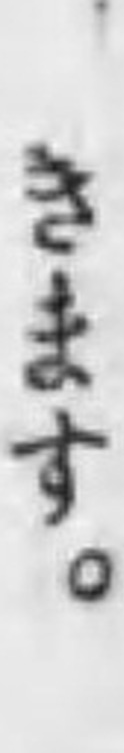きます。
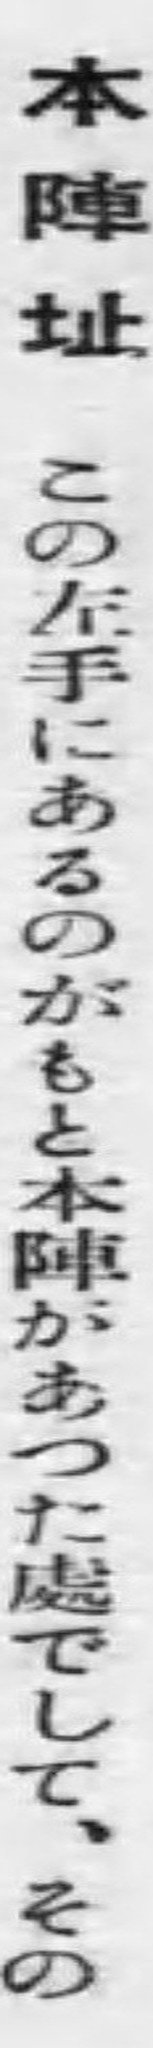本陣址この左手にあるのがもと本陣があつた処でして、その
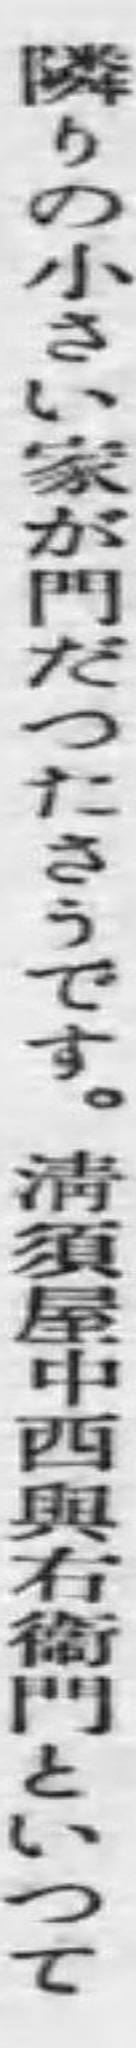隣りの小さい家が門だつたさうです。清須屋中西与右衛門といつて
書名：東三河道中記 : 豊橋市及其附近案内
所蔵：国立国会図書館 National Diet Library, JAPAN
